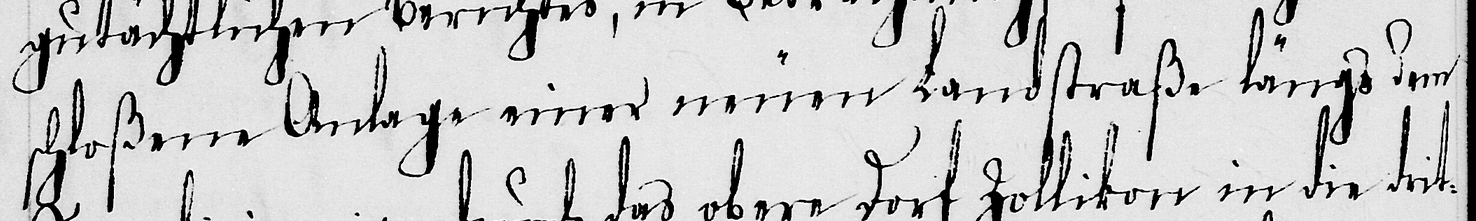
schloßene Anlage einer neuen Landstraße längs dem
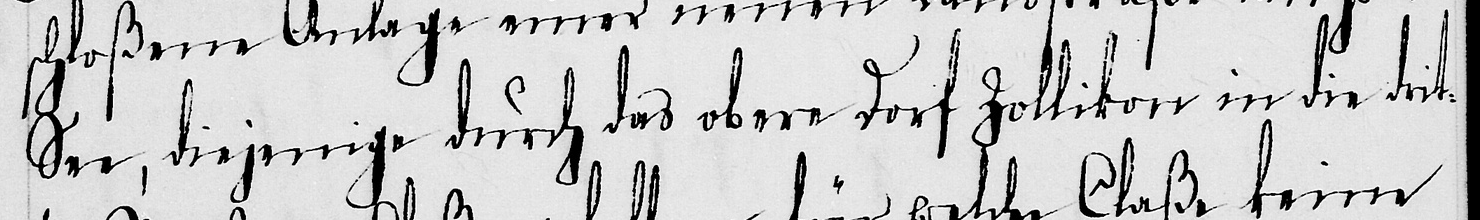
See, diejenige durch das obere Dorf Zollikon in die dtri¬
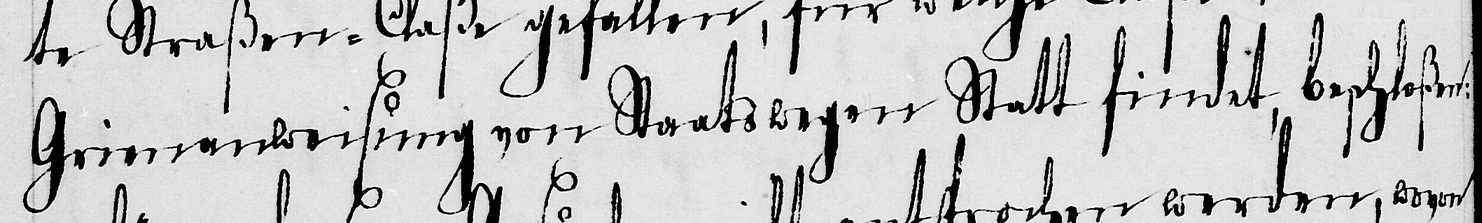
Grienanweisung von Staatswegen Statt findet, beschloße¬
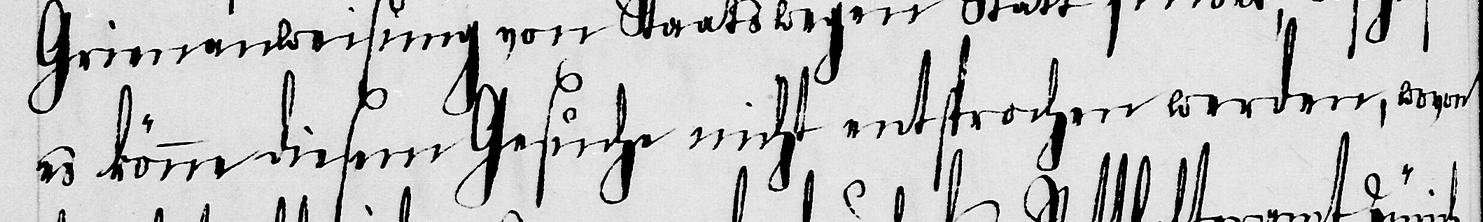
es könne diesem Gesuche nicht entsprochen werden, wo¬
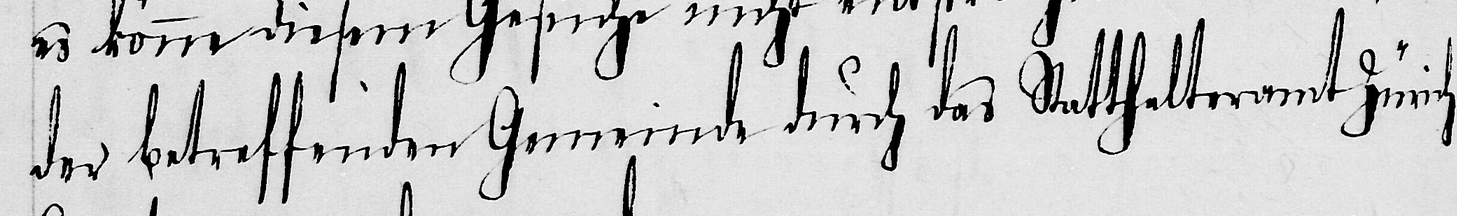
der betreffenden Gemeinde durch daß Statthalteramt
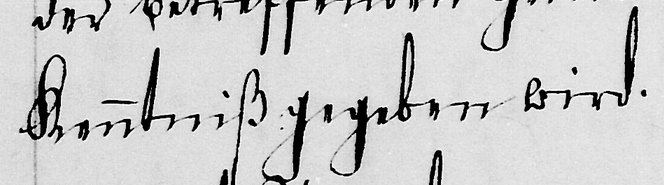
Kenntniß gegeben wird.
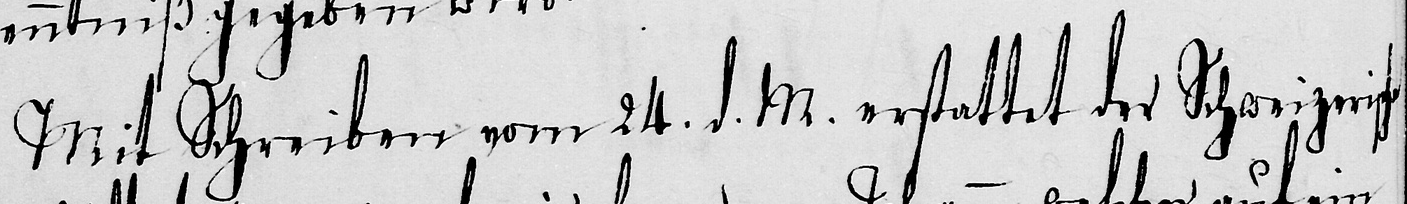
Mit Schreiben vom 24. d. M. erstattet der Schweizeri¬
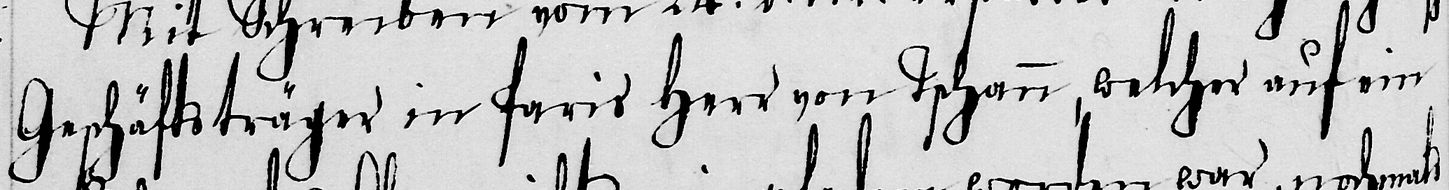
Geschäftsträger in Paris Herr von Tschann, welcher auf ein
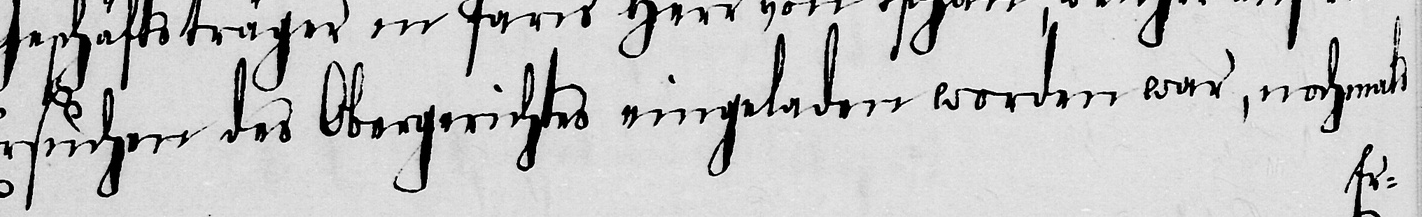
suchen des Obergerichtes eingeladen worden war, nochma¬
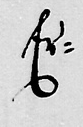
Er¬
